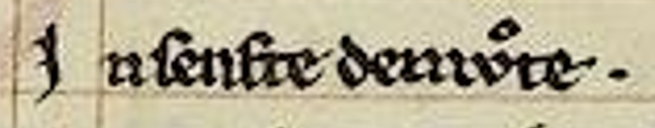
In ſenfte demv°ote.
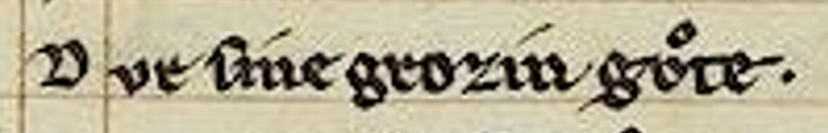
Dvr ſine grozin gv°ote.
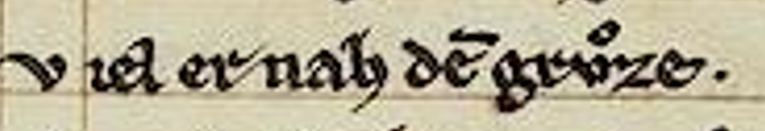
Viel er nah de(m) grv°oze.
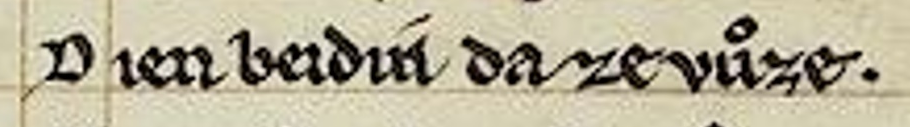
Dien beidin da ze vu°oze.
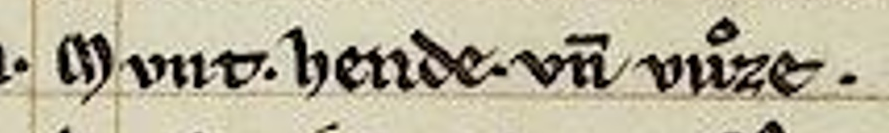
Mvnt. hende. vn(d) vu°oze.
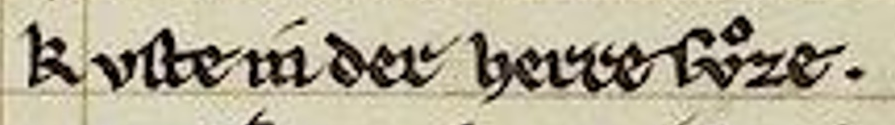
Kvſte in der herre ſv°oze.
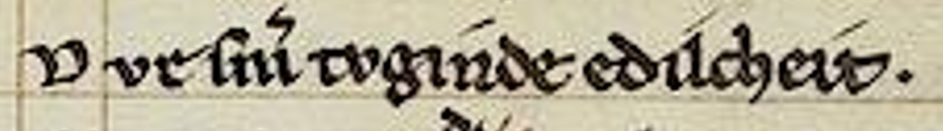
Dvr ſin(er) tvginde edilcheit.
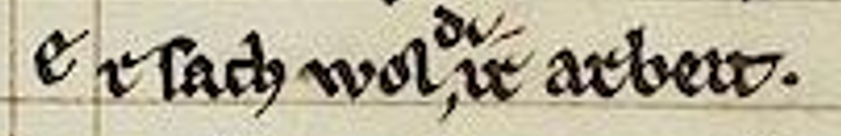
Er ſach wol °(d(az)) ir arbeit.
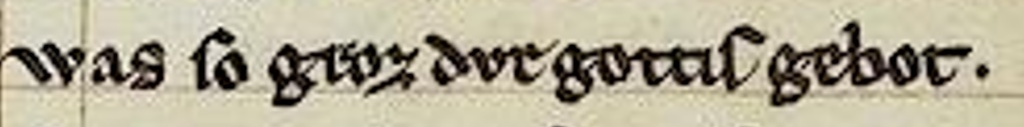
Was ſo groz dvr gottiſ gebot.
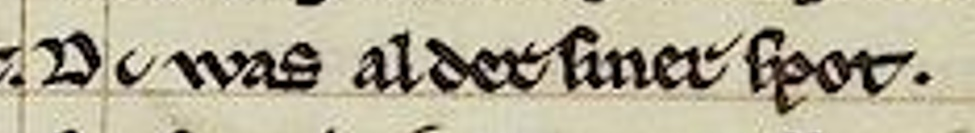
D(az) was al der ſiner ſpot.
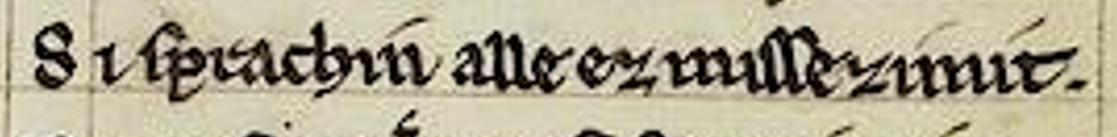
Si ſprachin alle ez miſſezimit.
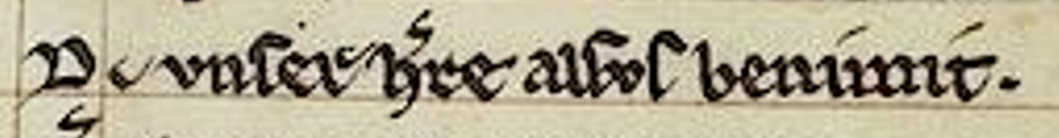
D(az) vnſer h(er)re alſvſ benimit.
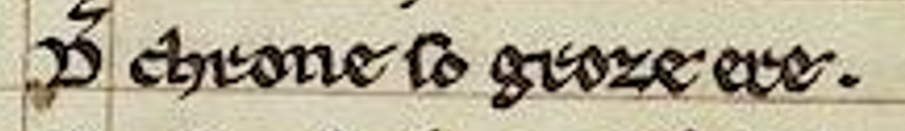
D(er) chrone ſo groze ere.
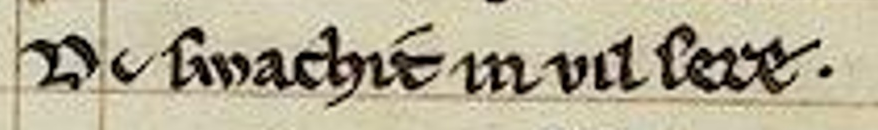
D(az) ſwachit in vil ſere.
